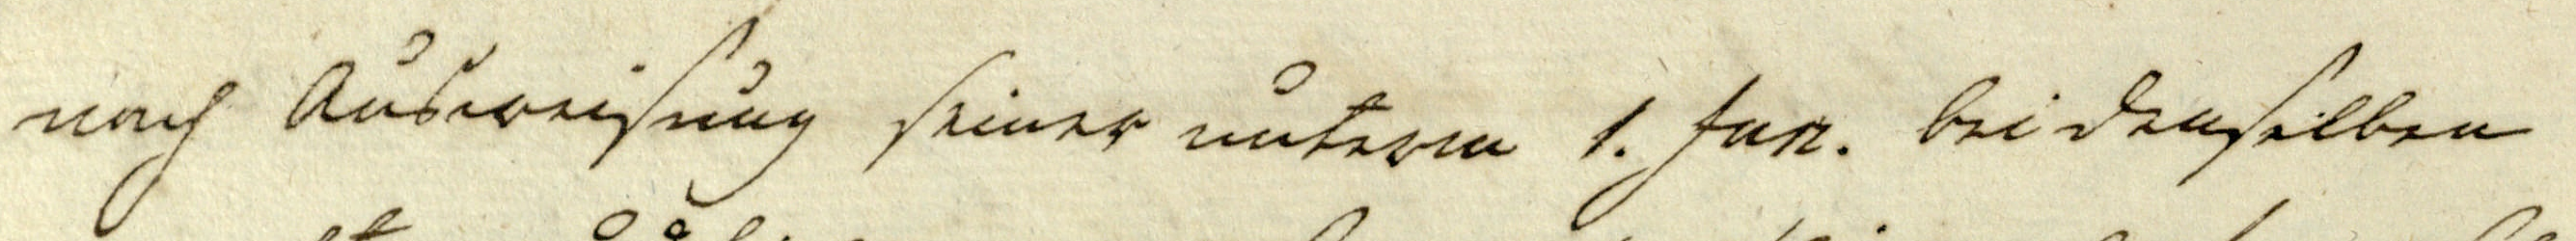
nach Ausweisung seiner unterm 1. Jun. bei denselben
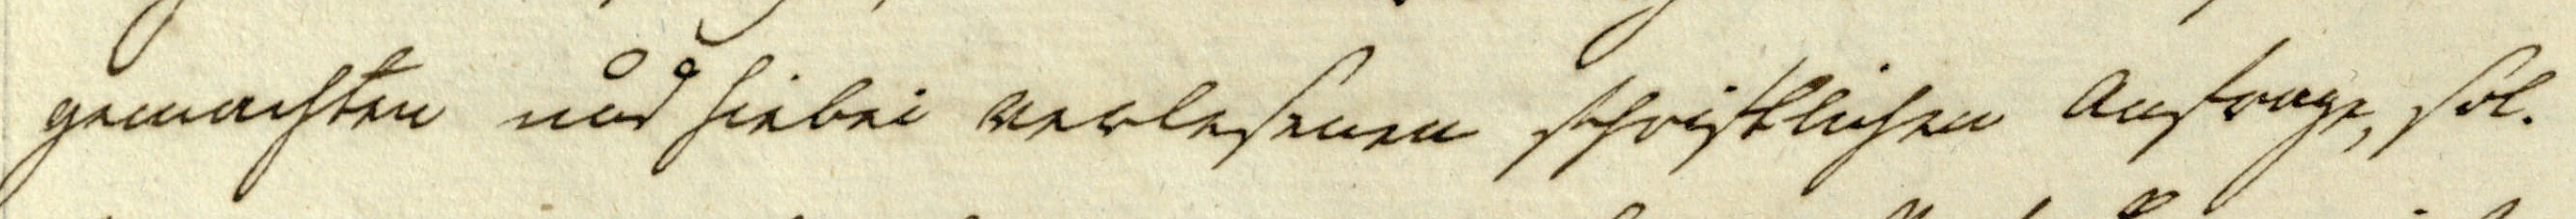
gemachten und hiebei verlesenen schriftlichen Anfrage sol¬
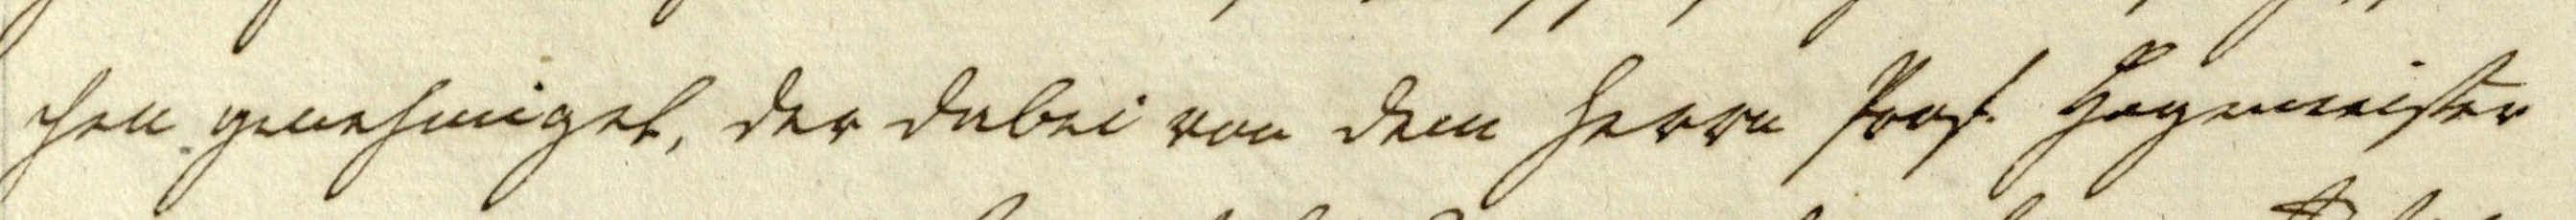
chen genehmiget, der dabei von dem herrn Prof. Hagemeister
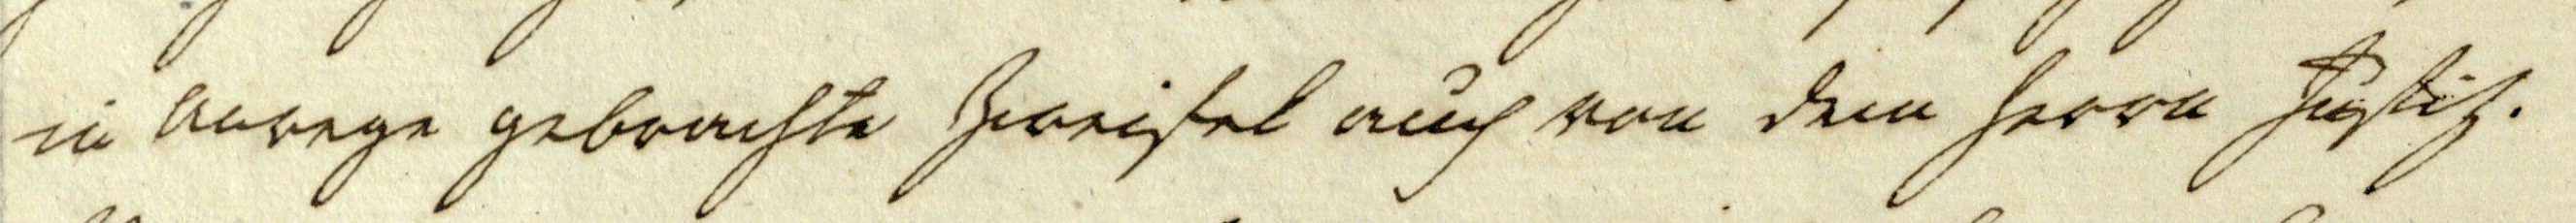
in Anrege gebrachte Zweifel auch von dem herrn Justiz¬
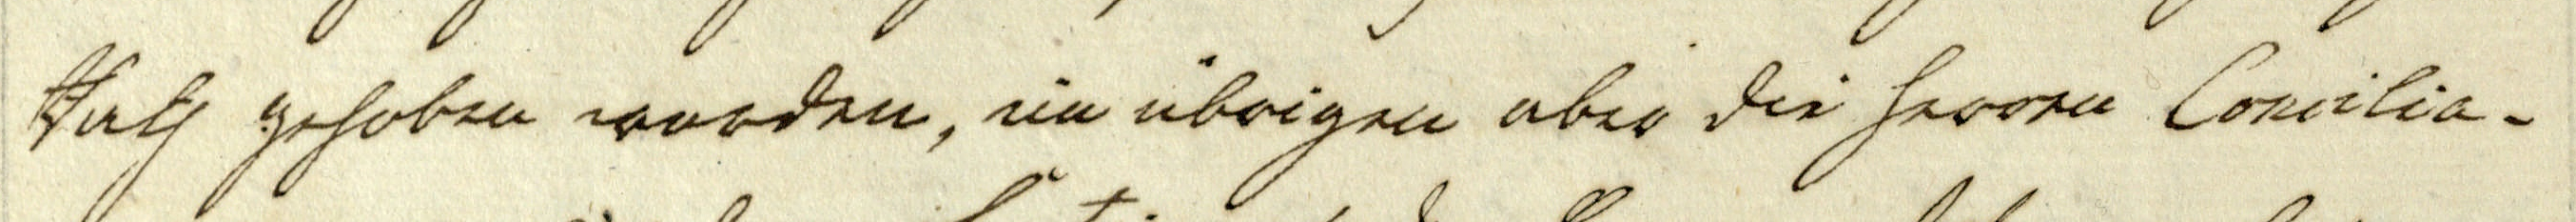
Rath gehoben worden, im übrigen aber die herren Concilia¬
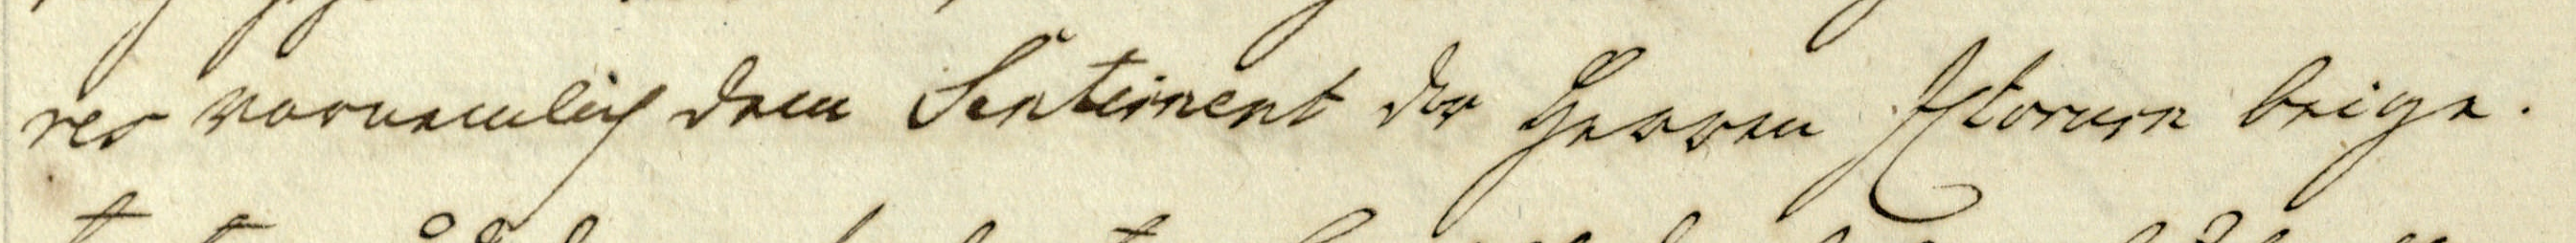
res vornemlich dem Sentiment der Herren Iltorum beige¬
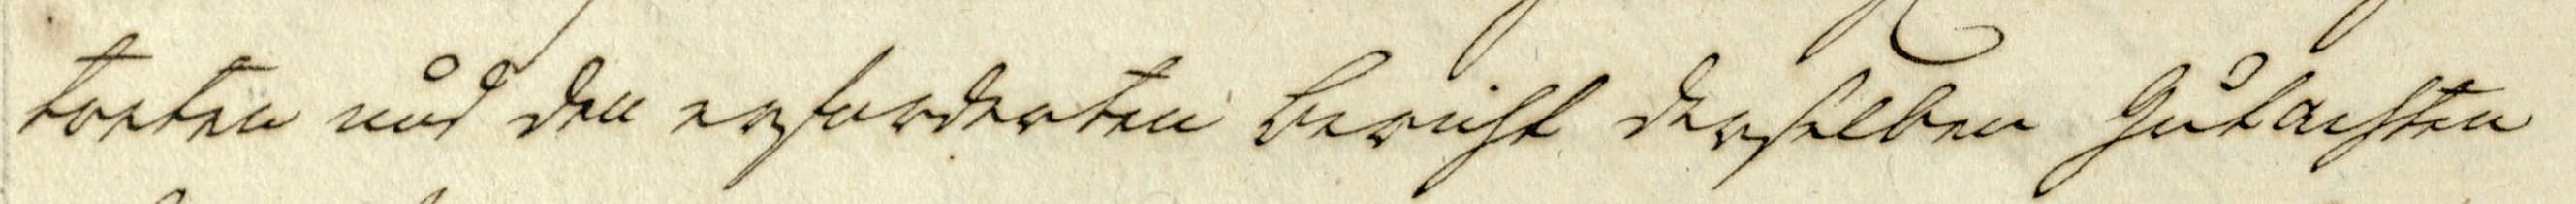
treten und den erforderten Bericht derselben Gutachten
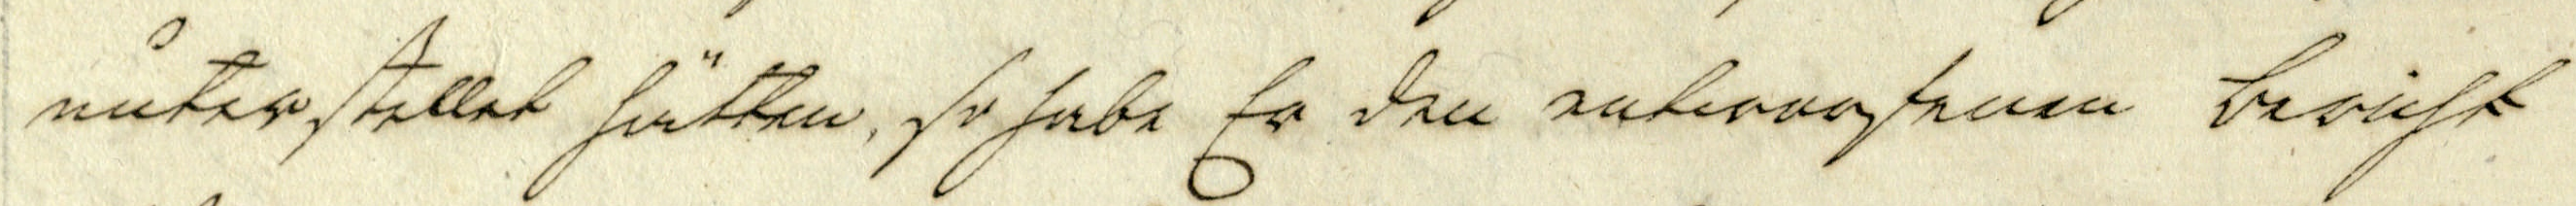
unterstellet hätten, so habe Er den entworfenen Bericht
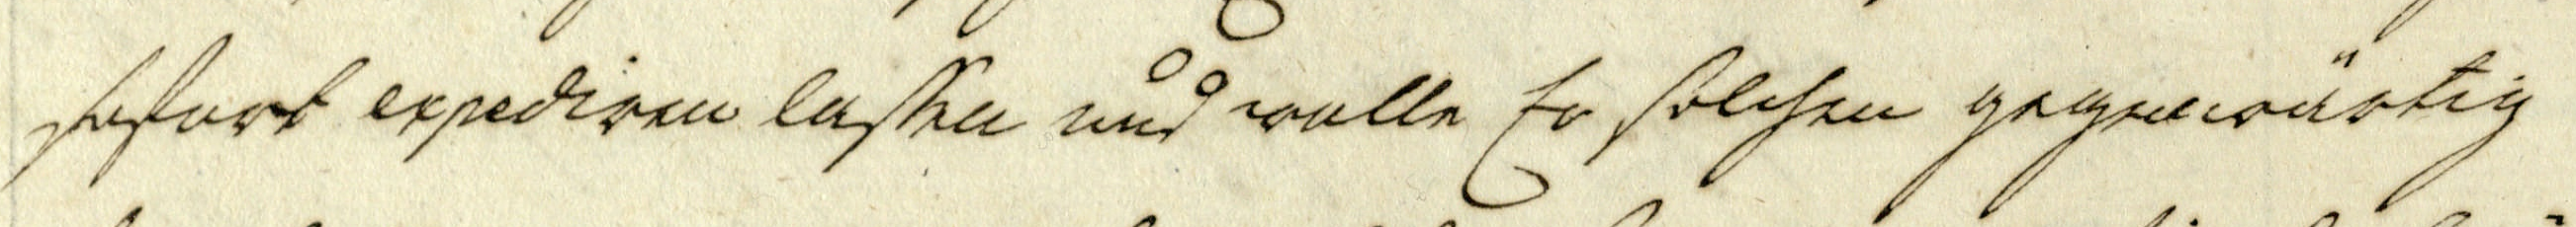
sofort expediren lassen und wolle Er solchen gegenwärtig
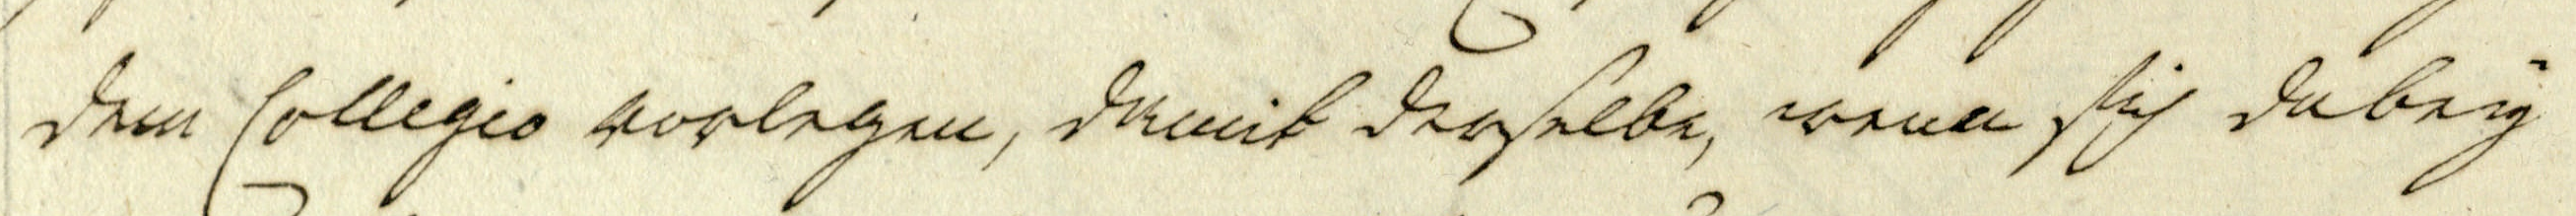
dem Collegoi vorlegen, damit derselbe, wenn sich dabeÿ
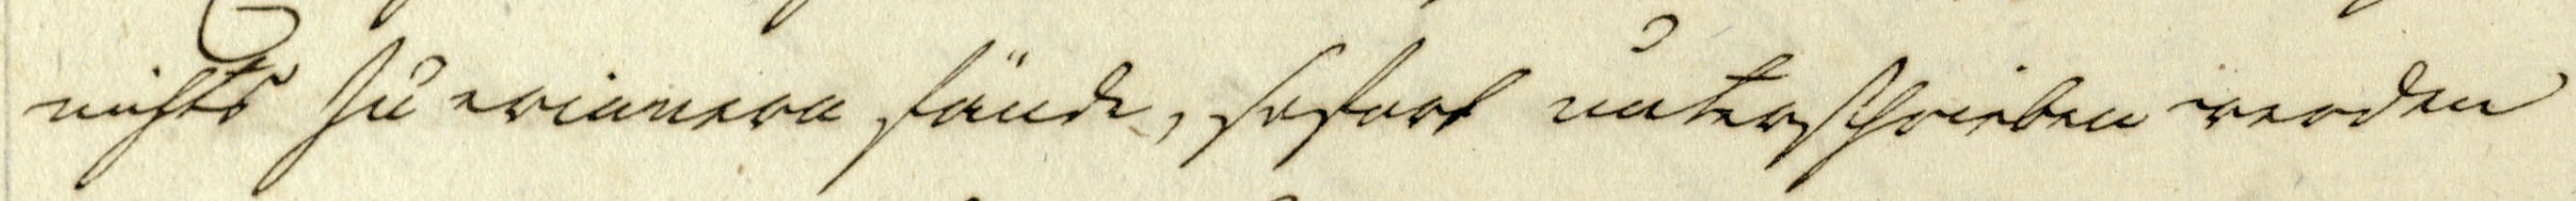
nichts zu erinnern fände, sofort unterschrieben werden
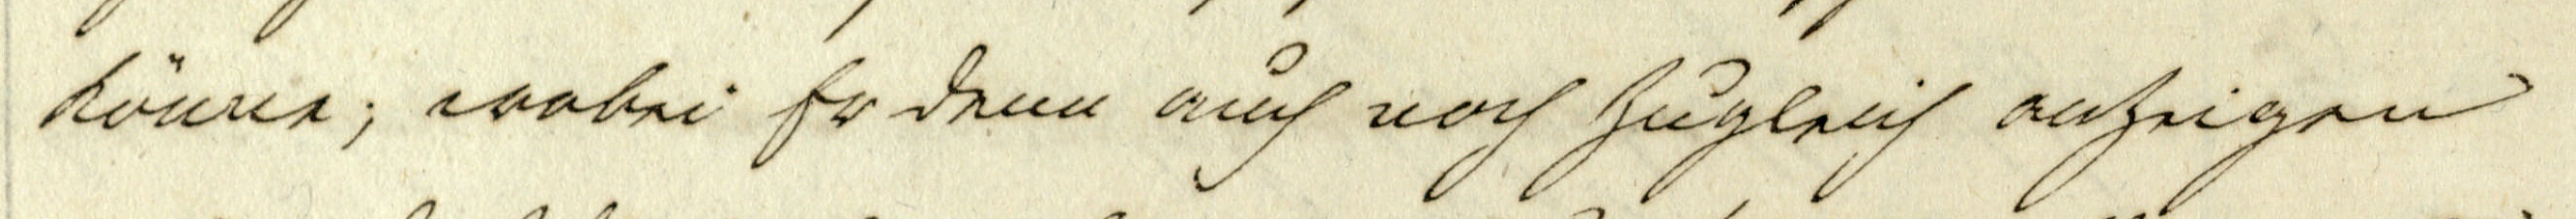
könne; wobei Er denn auch noch zugleich anzeigen
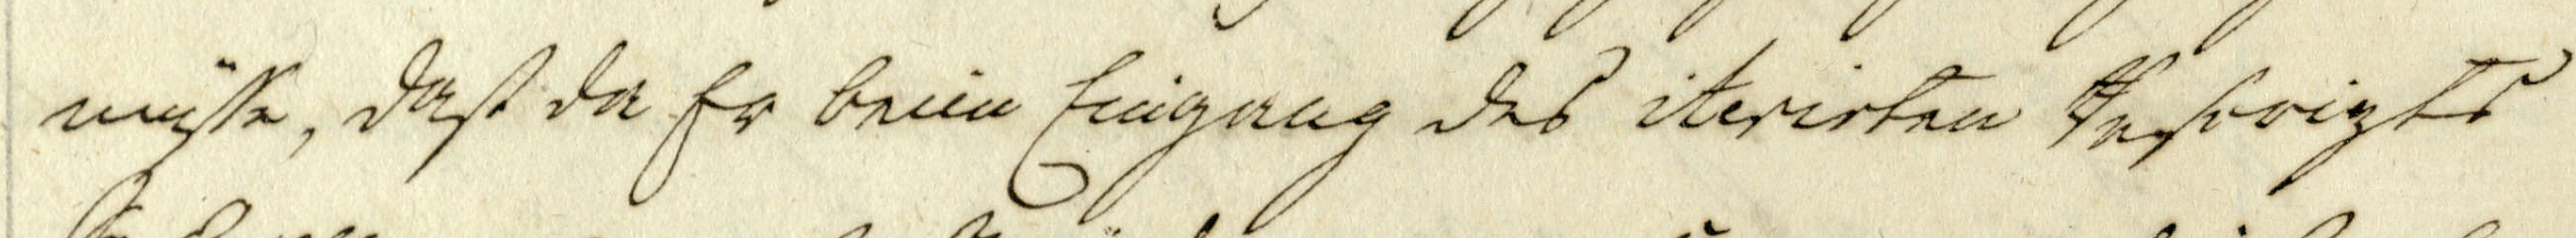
müsse, daß da Er beim Eingang des iterirten Rescripts
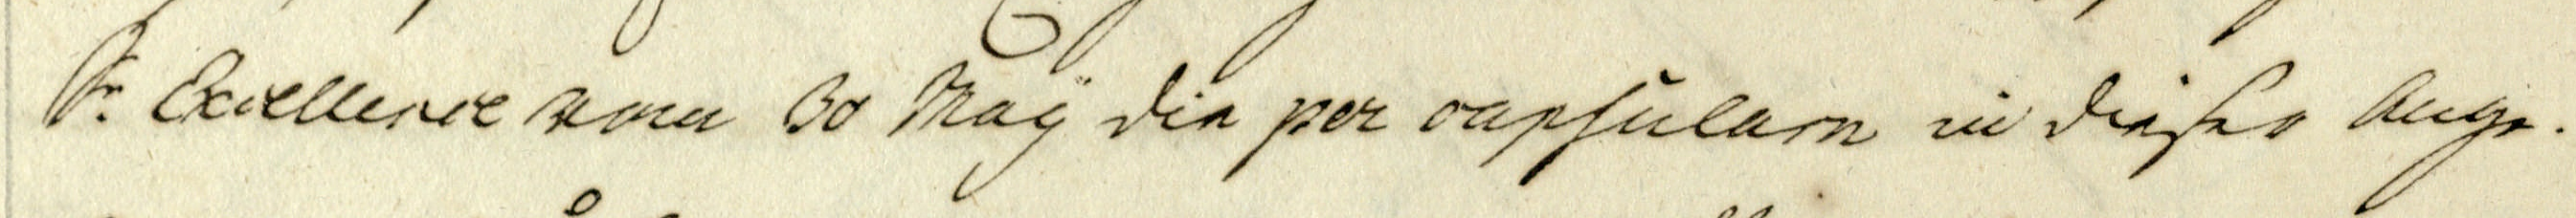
Sr. Excellence vom 30 Maÿ die per capsulam in dieser Ange¬
